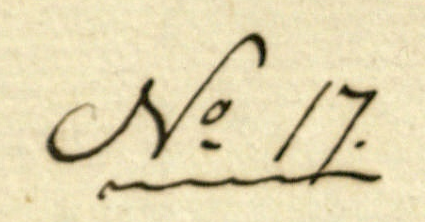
No 17.
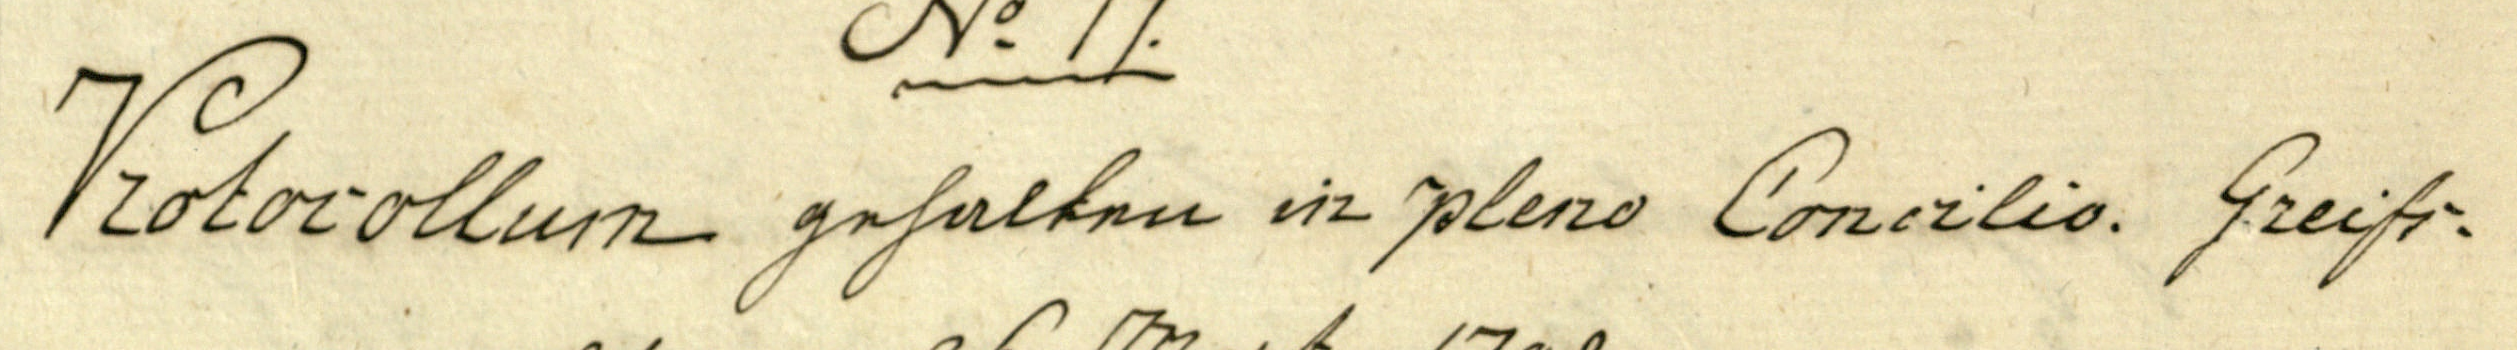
Protocollum gehalten in pleno Concilio. Greifs¬
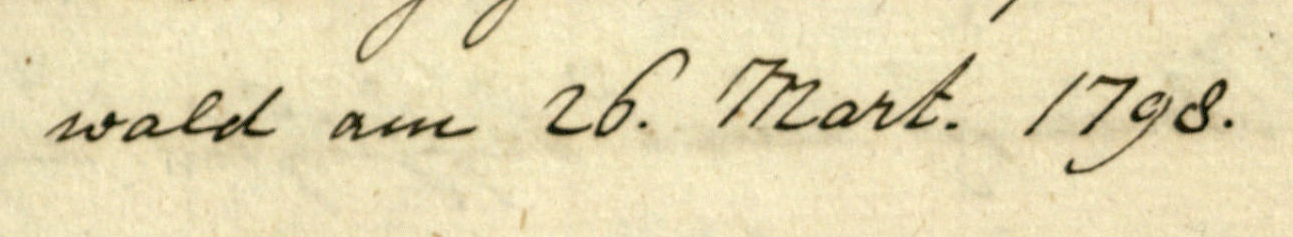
wald am 26. Mart. 1798.
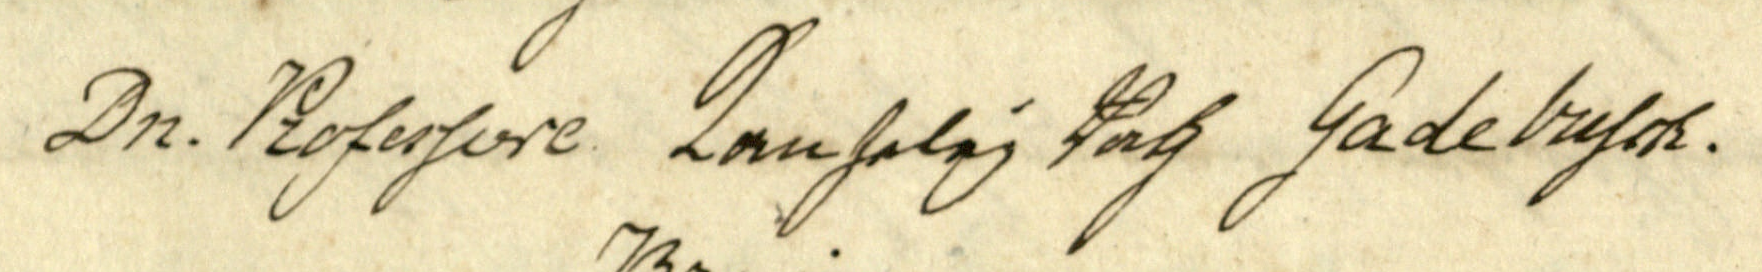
den. Professore Kanzeleÿ Rath Gadebusch.
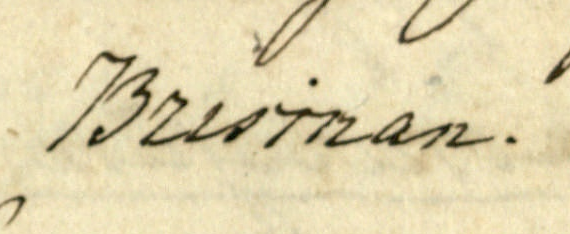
Brisman.
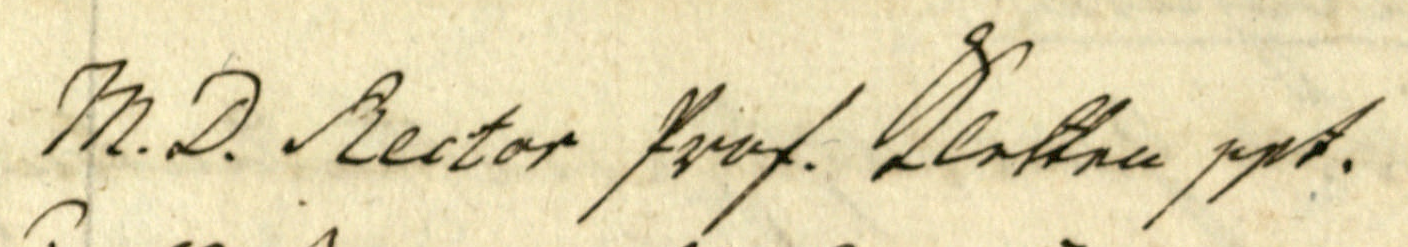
M. D. Rector Prof. Kletten ppt.
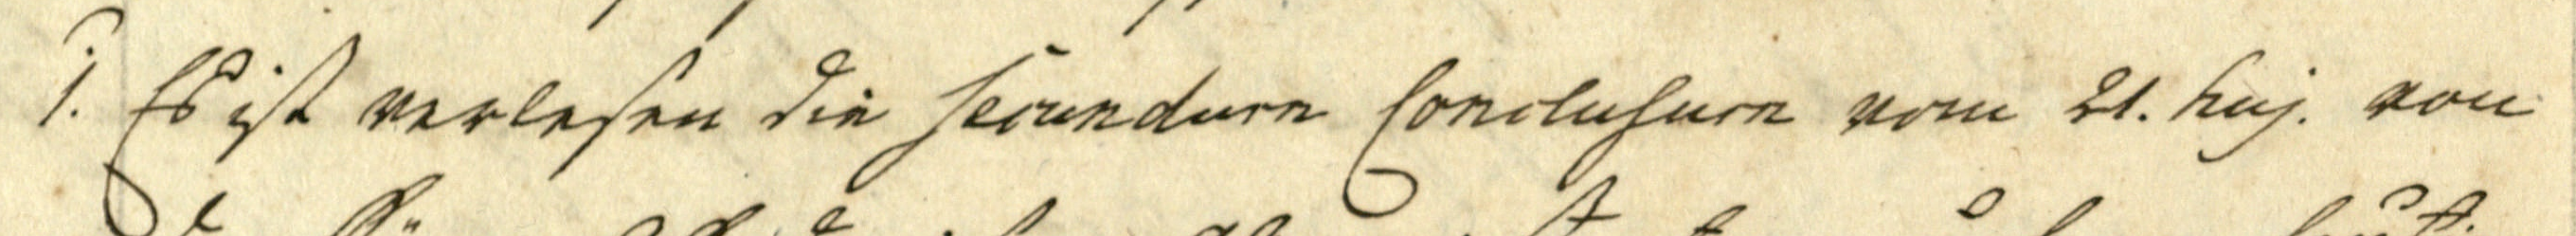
1. Es ist verlesen die secundum Conclusum vom 21. huj. von
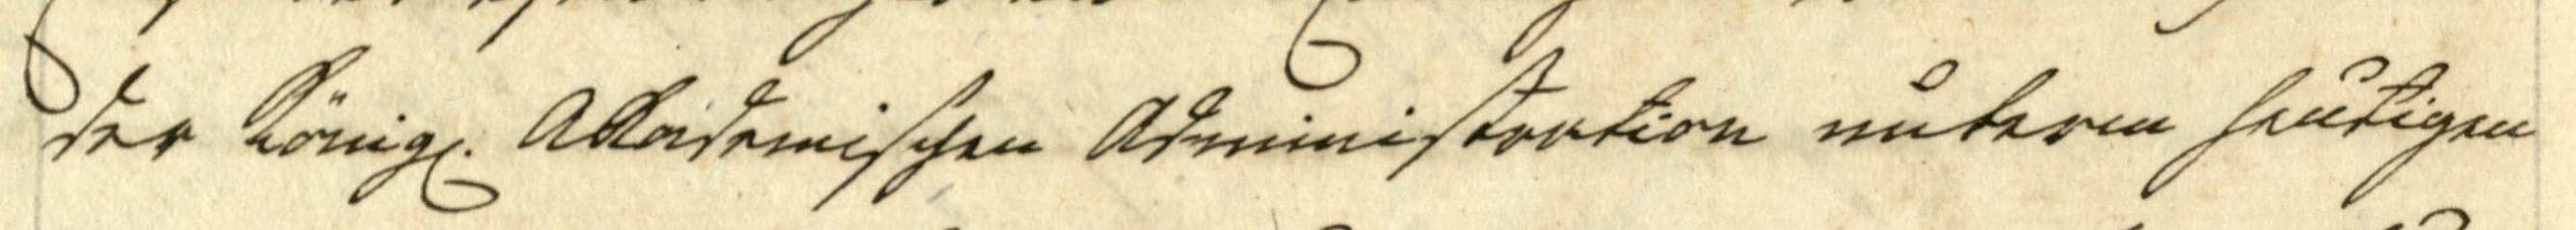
er Königl. Akademischen Administration unterm heutigen
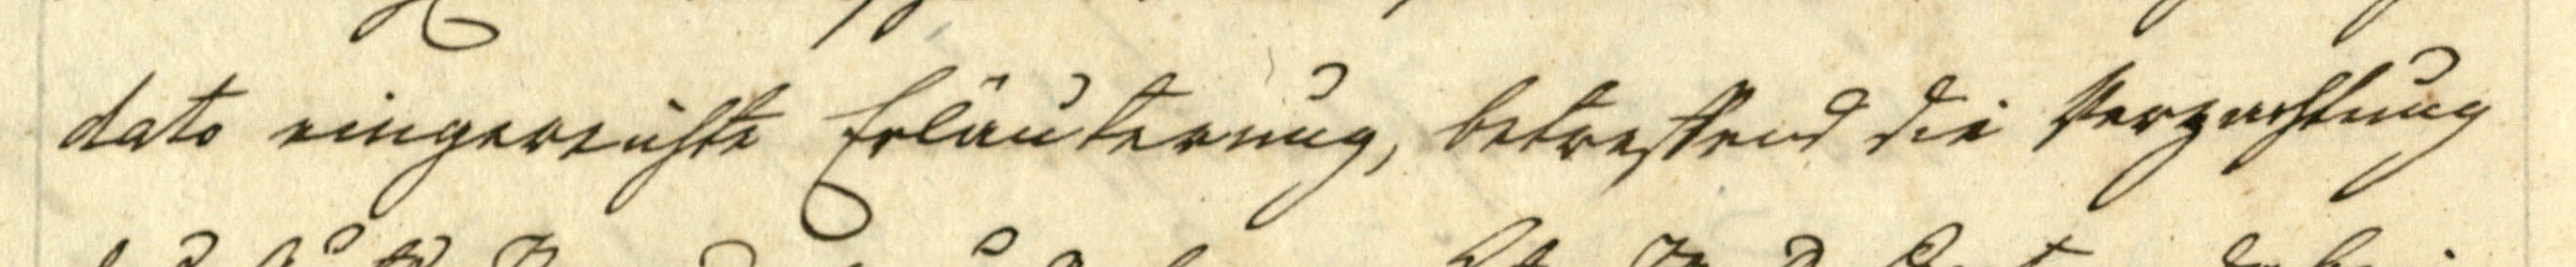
dato eingereichte Erläuterung, betreffend die Verpachtung
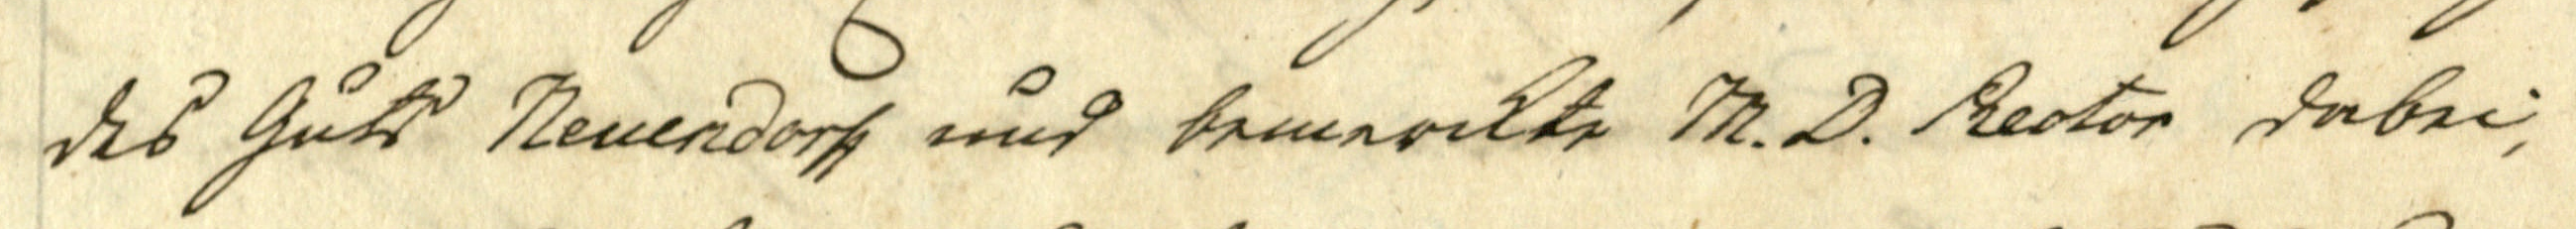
des Guts Neuendorff und bemerckte M. D. Rector dabei,
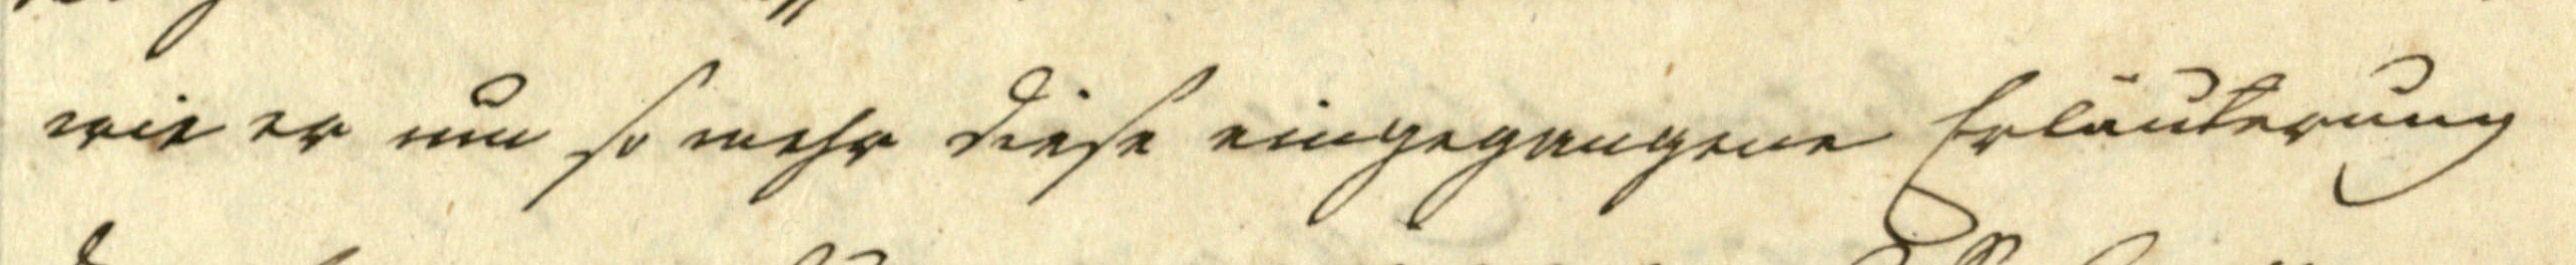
wie er um so mehr diese eingegangene Erläuterung
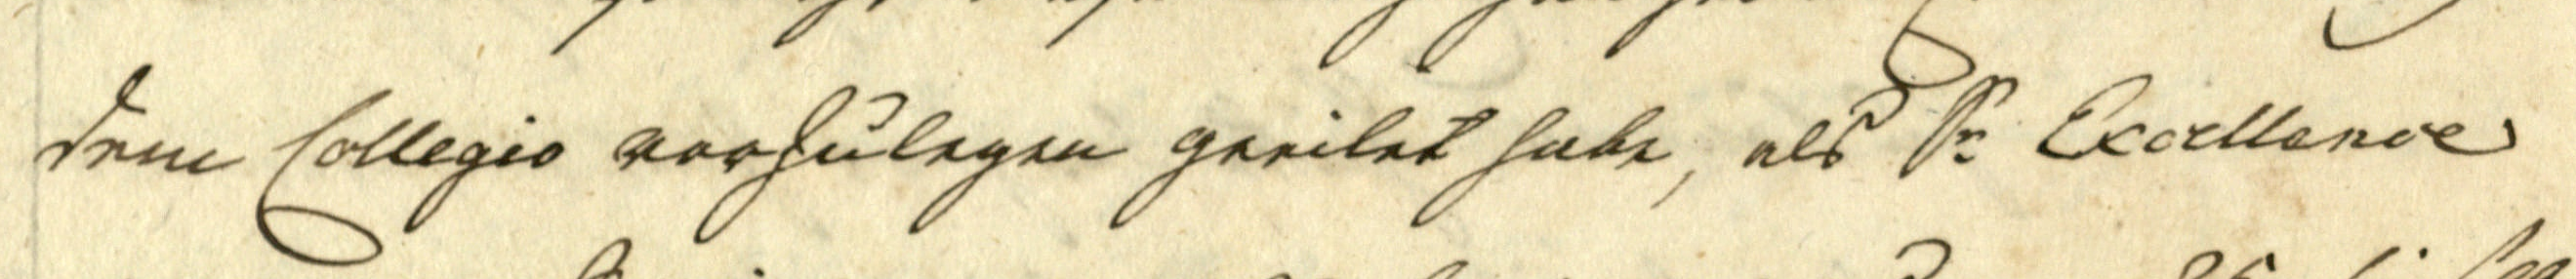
dem Collegio vorzulegen geeilet habe, als Sr Excellence
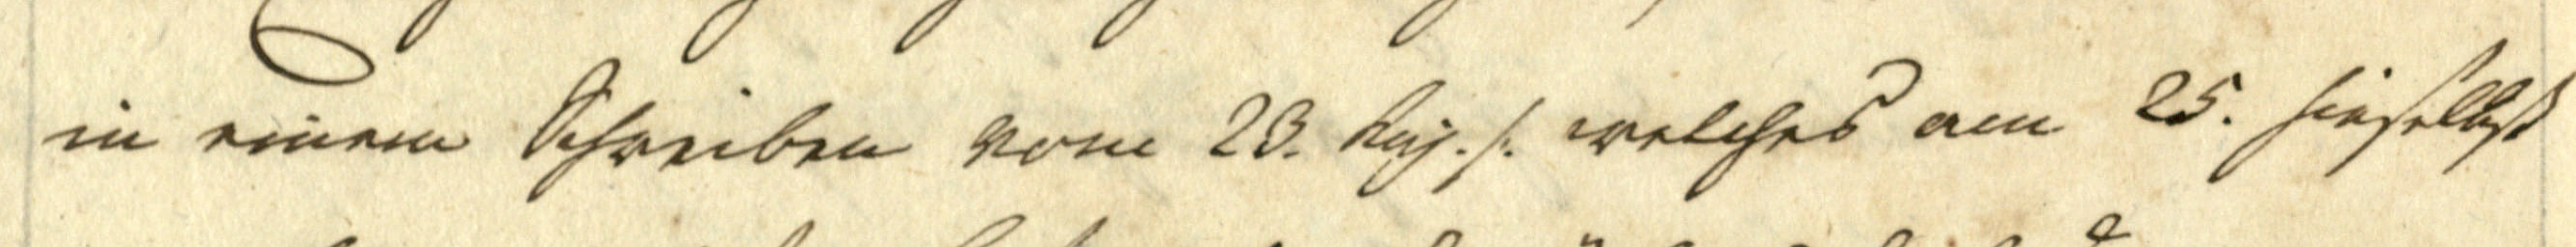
in einem Schreiben von 23. huj./: welches am 25. hieselbst
